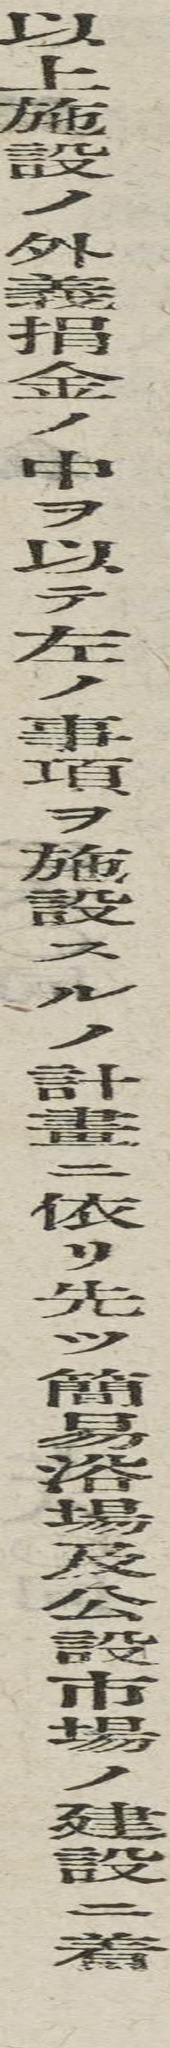以上施設ノ外義捐金ノ中ヲ以テ左ノ事項ヲ施設スルノ計画ニ依リ先ツ簡易浴場及公設市場ノ建設ニ着
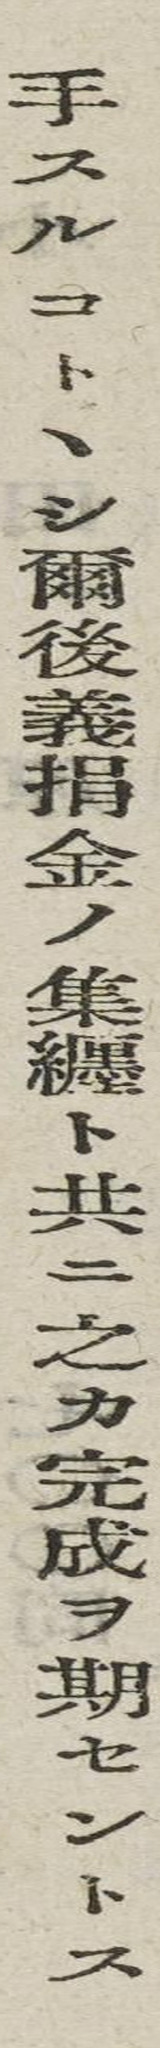手スルコトヽシ爾後義捐金ノ集纏ト共ニ之カ完成ヲ期セントス
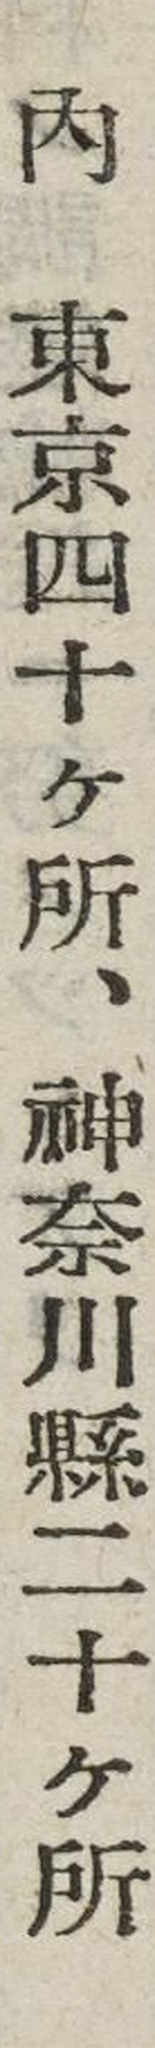内東京四十ケ所、神奈川県二十ケ所
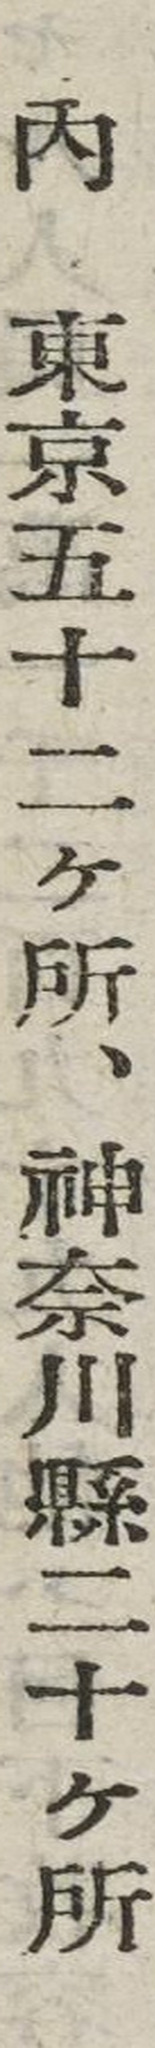内東京五十二ケ所、神奈川県二十ケ所
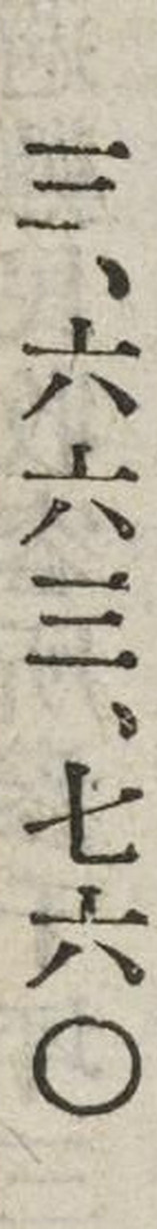計三、六六三、七六〇
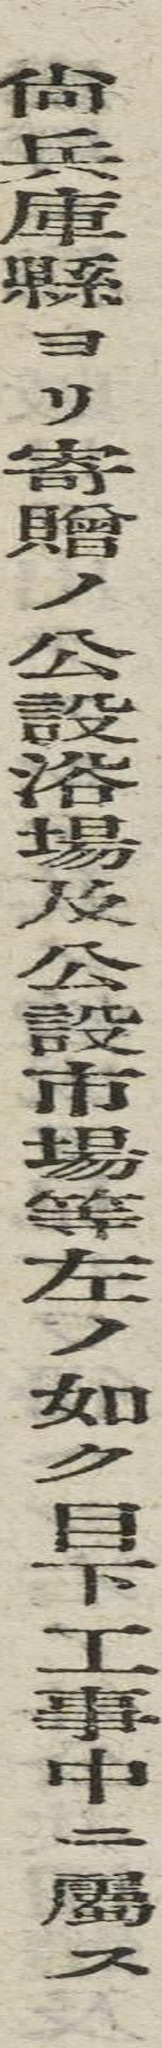尚兵庫県ヨリ寄贈ノ公設浴場及公設市場等左ノ如ク目下工事中ニ属ス
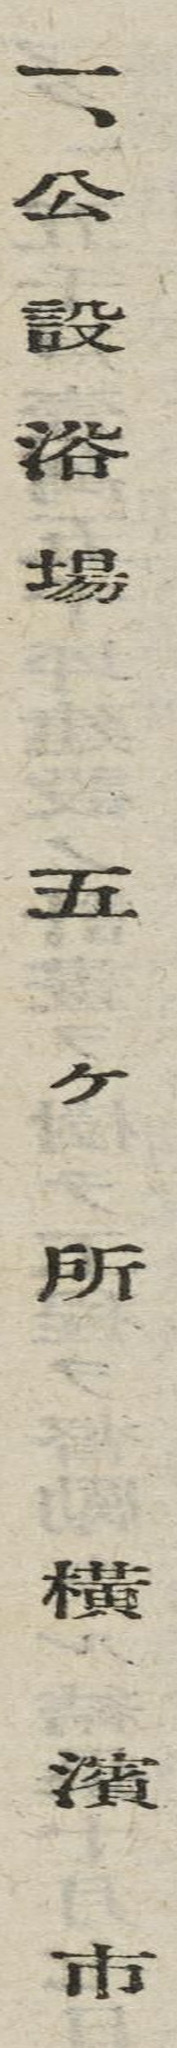一、公設浴場五ケ所横浜市
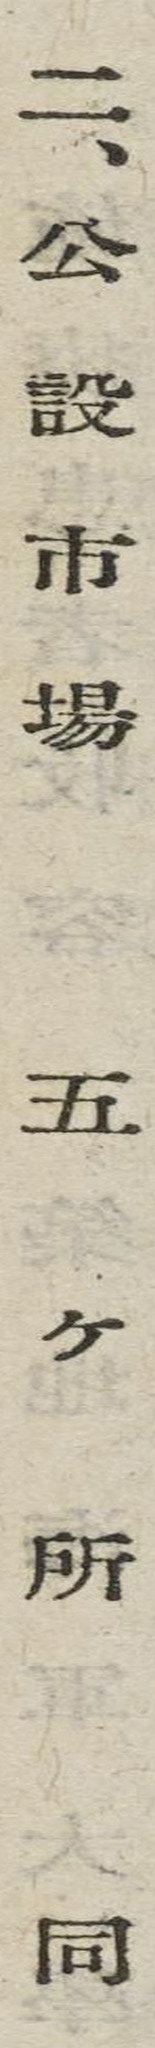ニ、公設市場五ケ所同
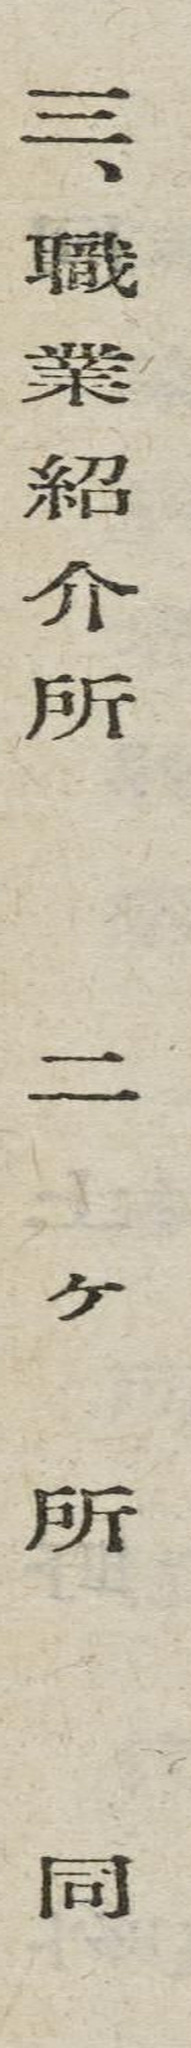三、職業紹介所ニケ所同
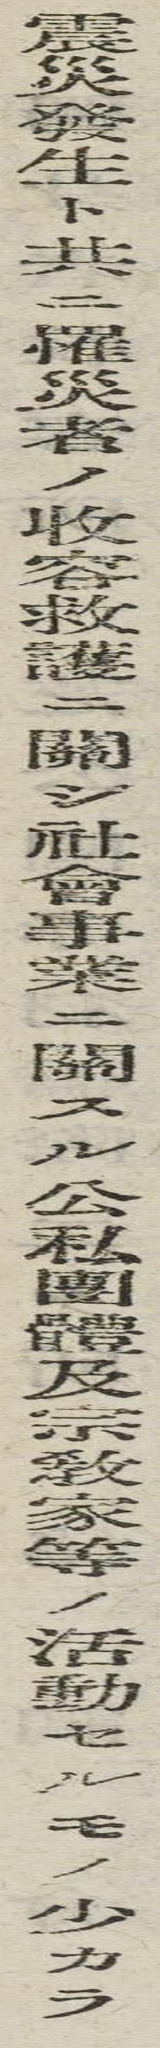震災発生ト共ニ罹災者ノ収容救護ニ関シ社会事業ニ関スル公私団体及宗教家等ノ活動セルモノ少カラ
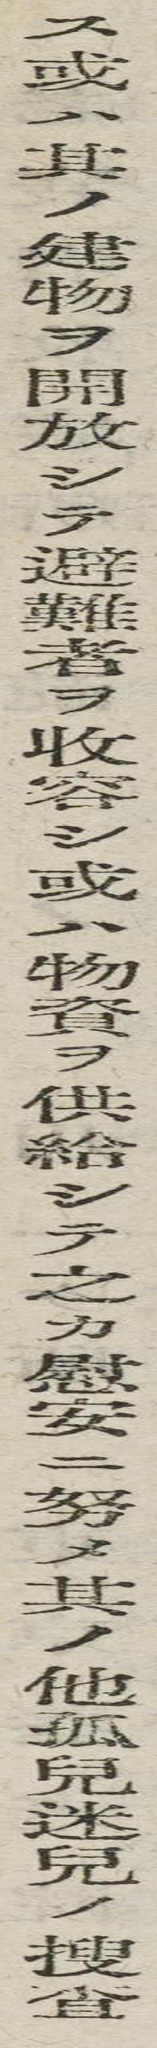ス或ハ其ノ建物ヲ開放シテ避難者ヲ収容シ或ハ物資ヲ供給シテ之カ慰安ニ努メ其ノ他孤児迷児ノ捜査
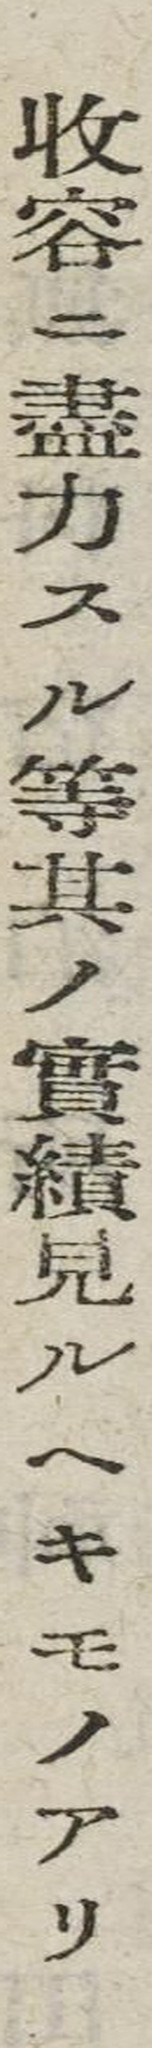収容ニ尽力スル等其ノ実績見ルヘキモノアリ
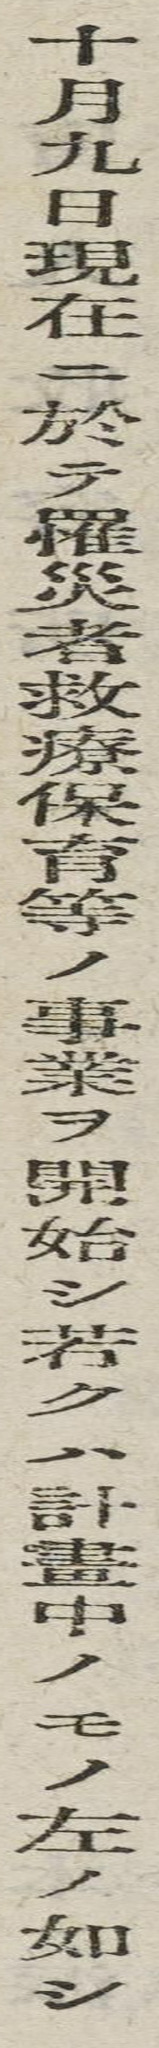十月九日現在ニ於テ罹災者救療保育等ノ事業ヲ開始シ若クハ計画中ノモノ左ノ如シ
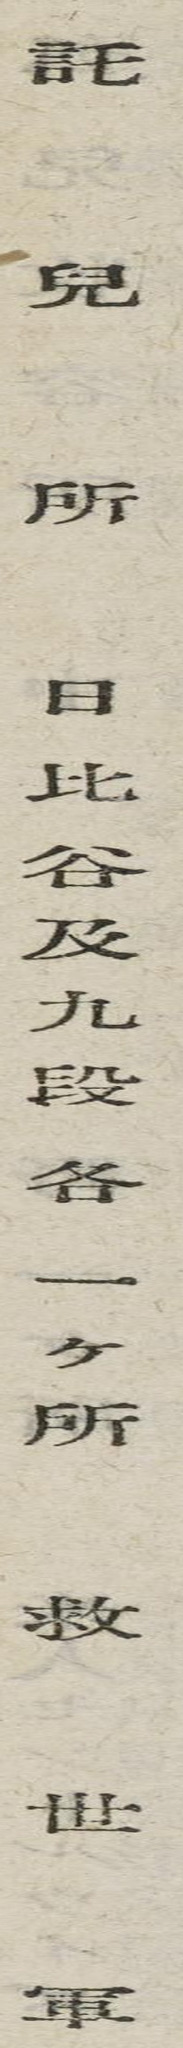託児所日比谷及九段各一ケ所救世軍
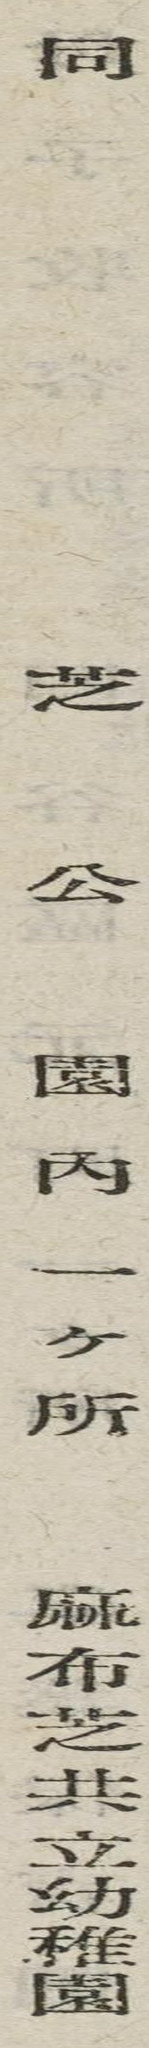同芝公園内一ケ所麻布芝共立幼稚園
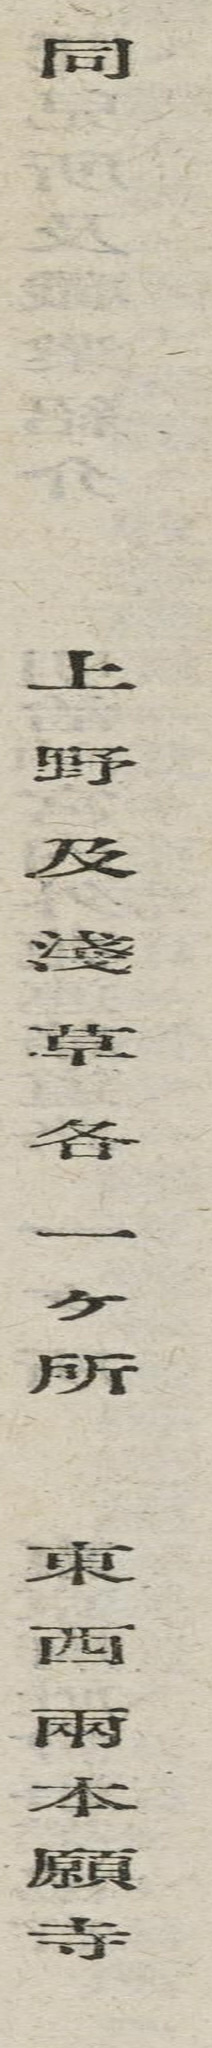同上野及浅草各一ケ所東西西本願寺
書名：震災被害状況並救護施設概要
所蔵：東京大学地震研究所図書室 Earthquake Research Institute Library, The University of Tokyo, JAPAN
